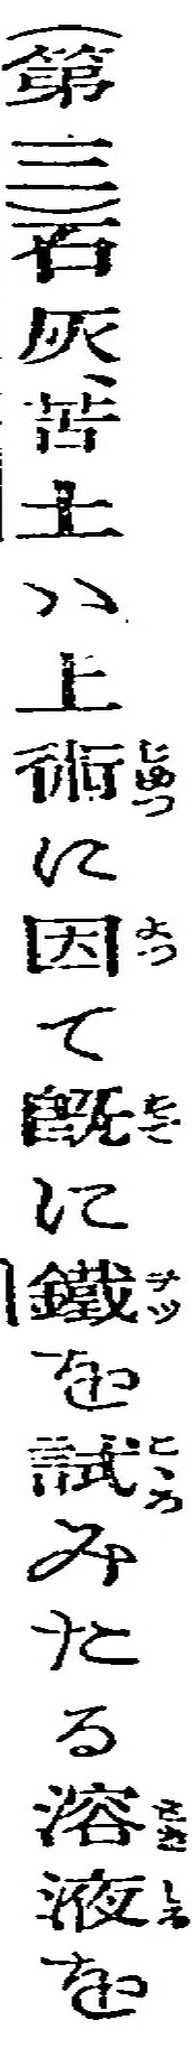[第三]石灰、苦土は上術に因て既に鐵を試みたる溶液を
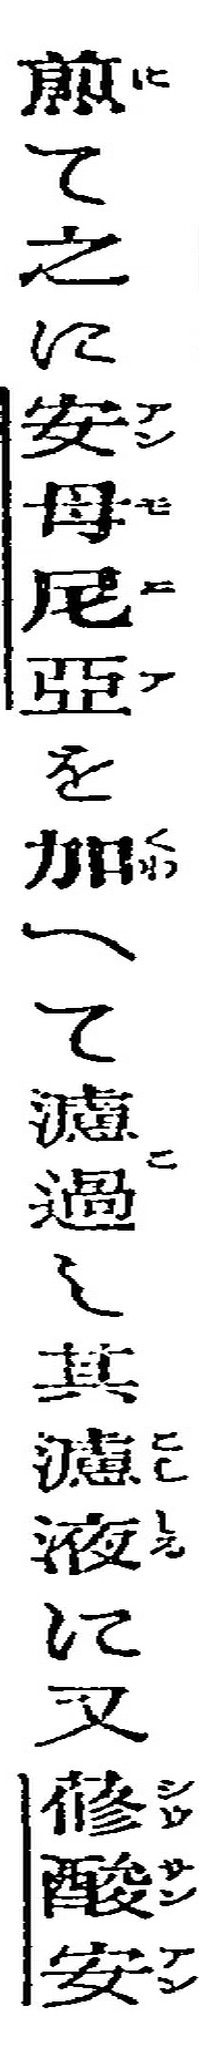煎て之に安母尼亞を加へて濾過し其濾液に又蓚酸安
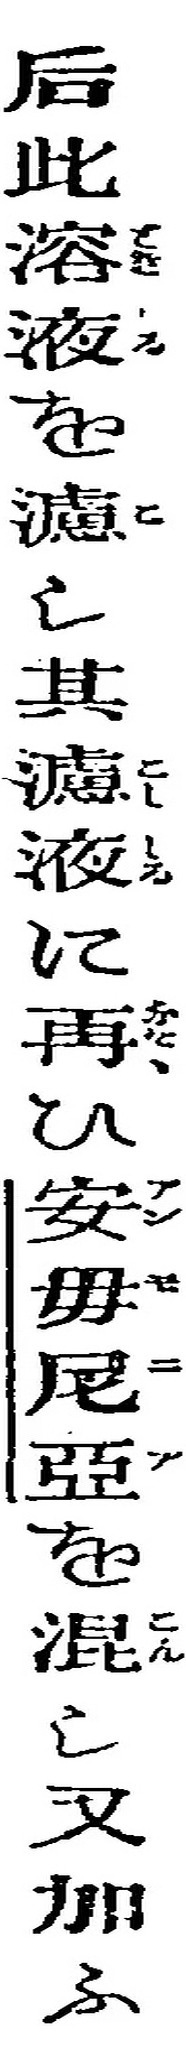后此溶液を濾し其濾液に再ひ安母尼亞を混し又加ふ

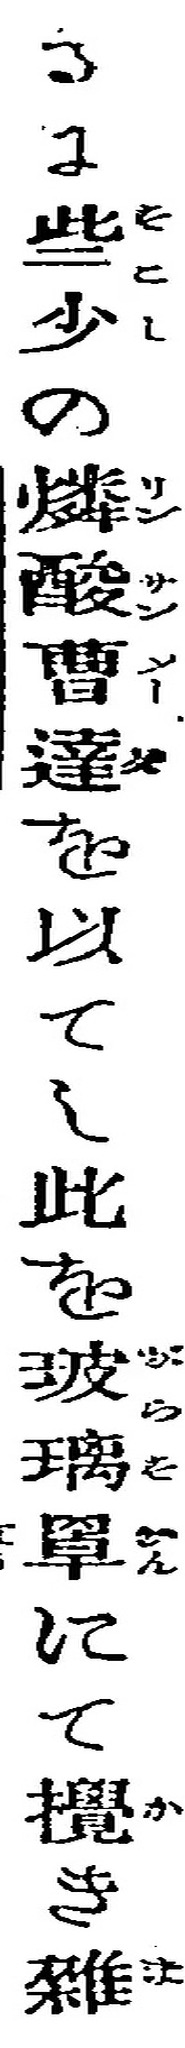るに些少の燐酸曹達を以てし此を玻璃罩にて攪き雑
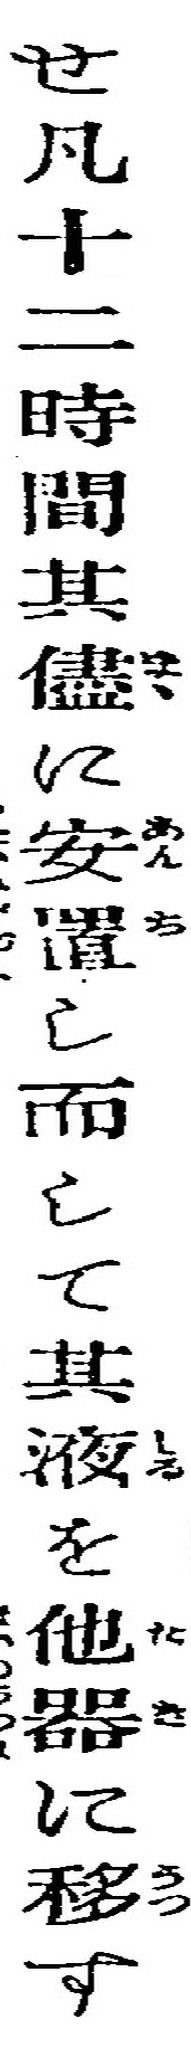せ凡十二時間其儘に安置し而して其液を他器に移す
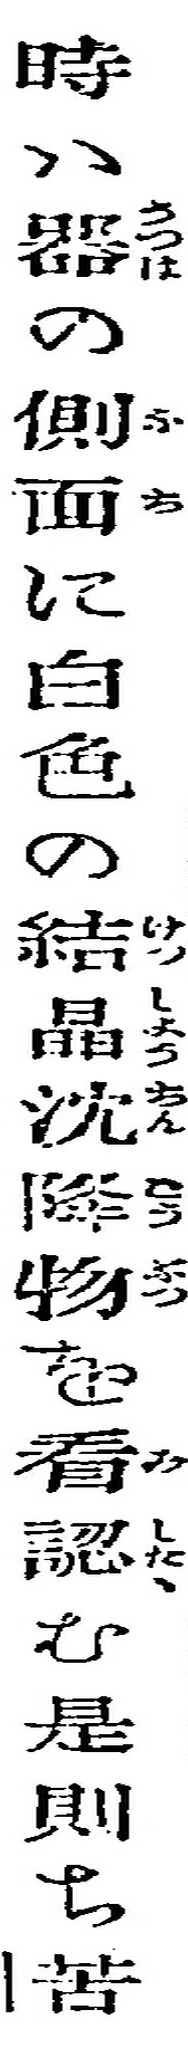時は器の側面に白色の結晶沈降物を看認む是則ち苦
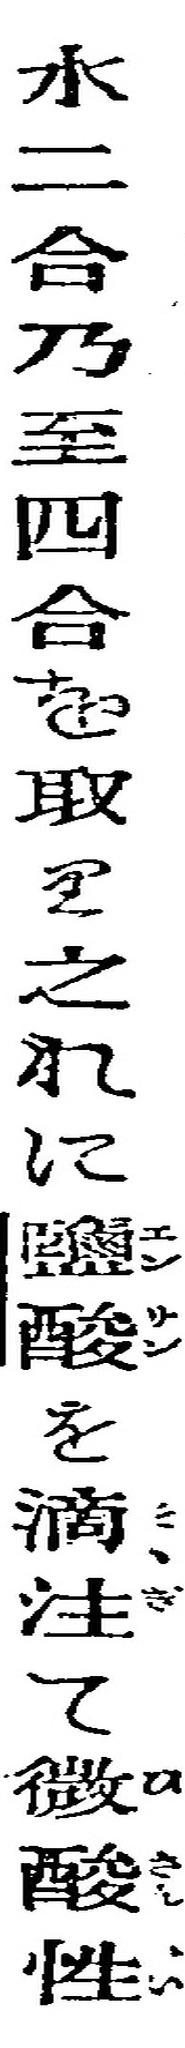水二合乃至四合を取り之れに鹽酸を滴注て微酸性
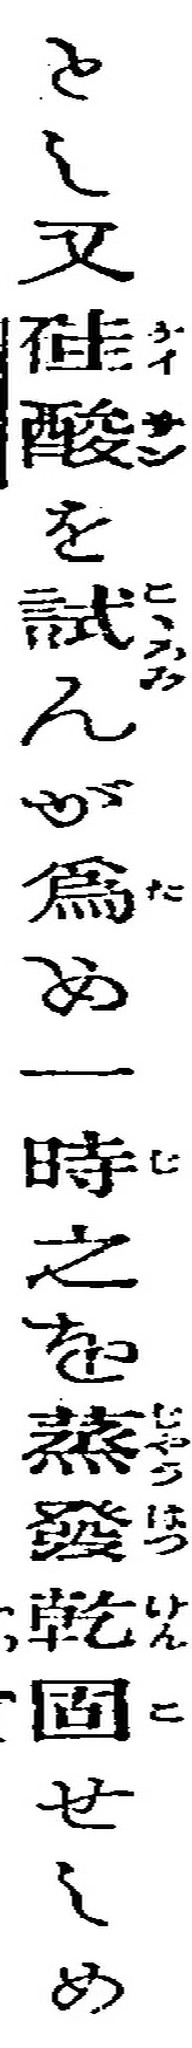とし又珪酸を試んが為め一時之を蒸発乾固せすめ
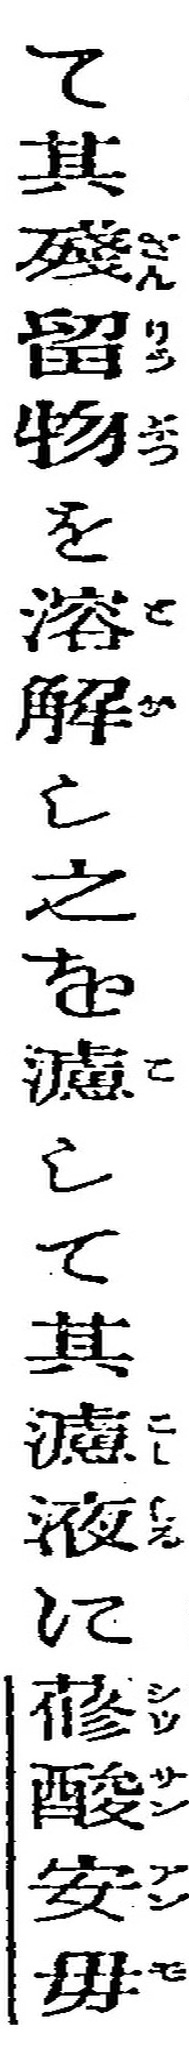て其残留物を溶解し之を濾して其濾液に蓚酸安母
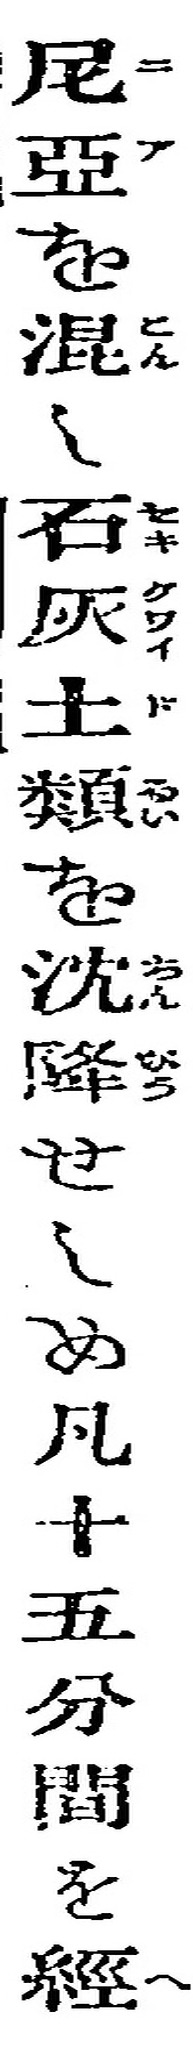尼亞を混し石灰土類を沈降せしめ凡十五分間を経
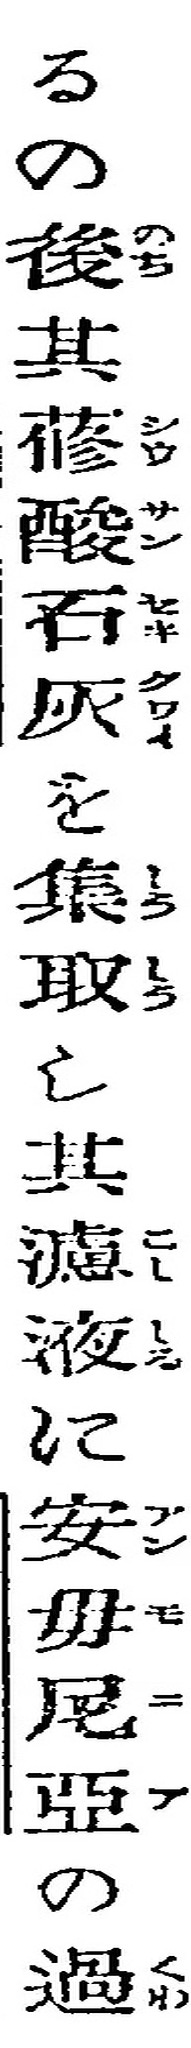るの後其蓚酸石灰を集取し其濾液に安母尼亞の過
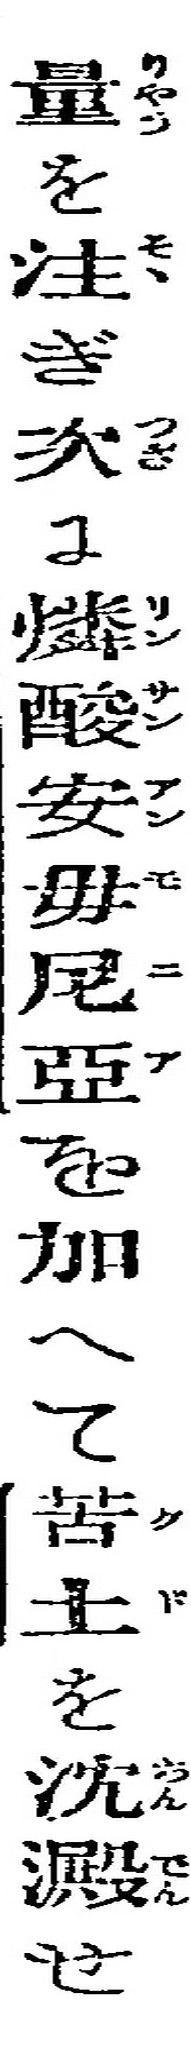量を注ぎ次に燐酸安母尼亞を加へて苦土を沈澱せ
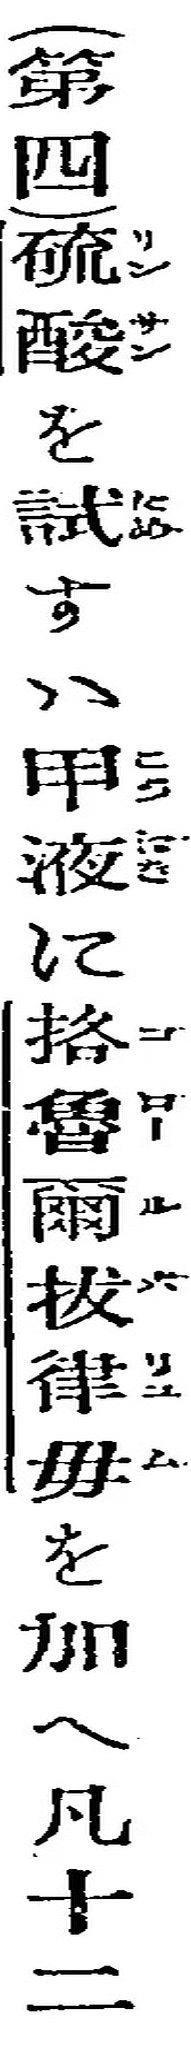[第四]硫酸を試すは甲液に挌魯爾抜律母を加へ凡十二
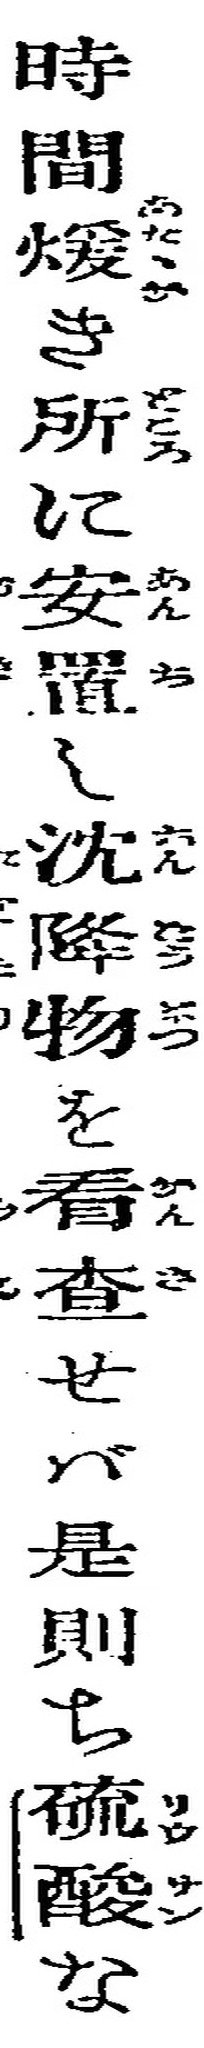時間煖き所に安置沈降物を看査せば是則ち硫酸な
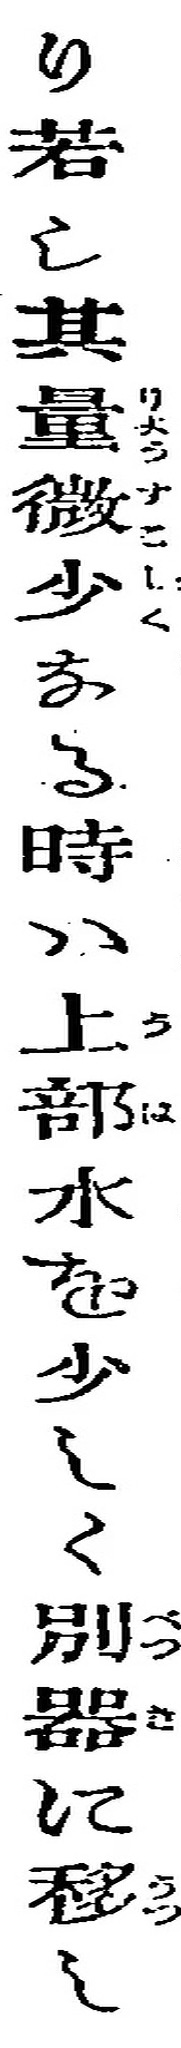り若し其量微少なる時は上部水を少しく別器に移し
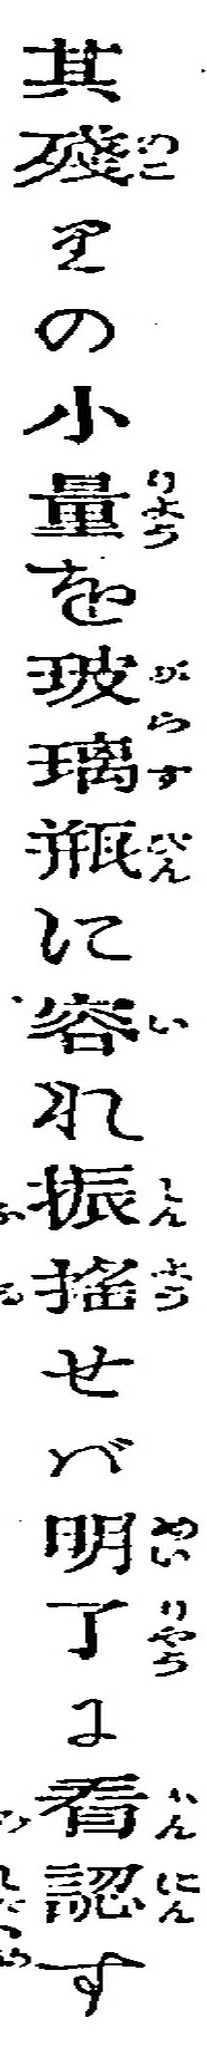其残りの小量を玻璃瓶に容れ振揺せば明了に看認す
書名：飲水の心得 : 伝染病の予防
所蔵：国立国会図書館 National Diet Library, JAPAN
